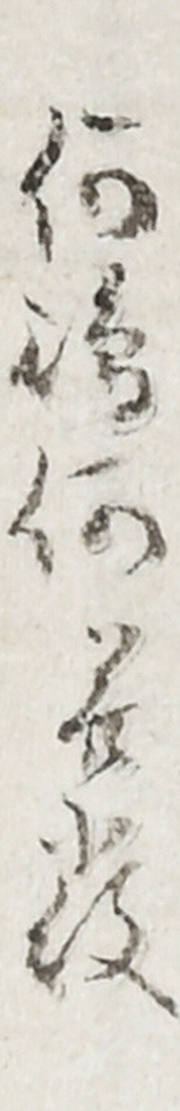何嶋何并数
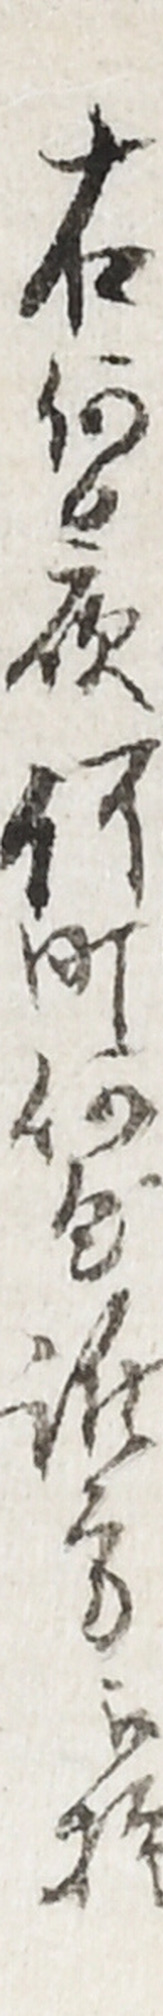右何日夜何町何屋誰方江捨
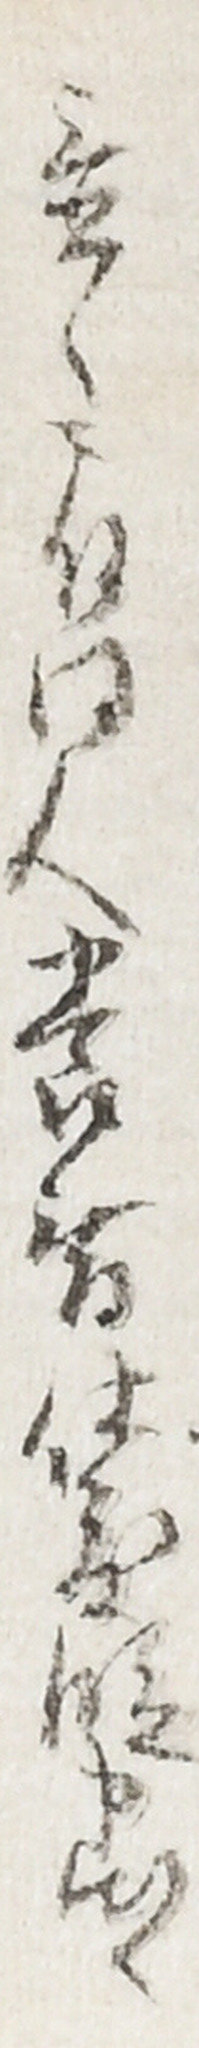置候ニ付同人養有之仕度段申出候
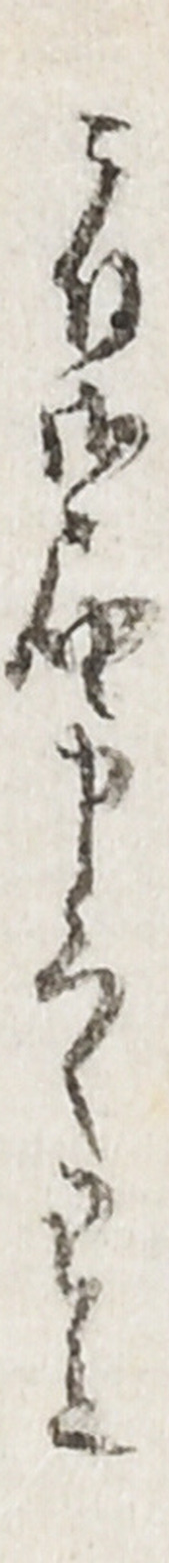被為御届申上候已上
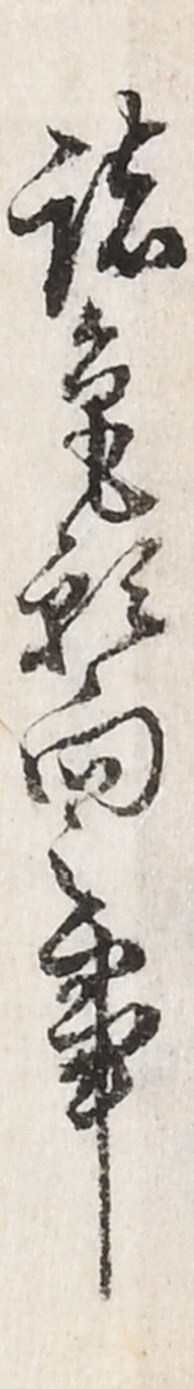諸色願向之事
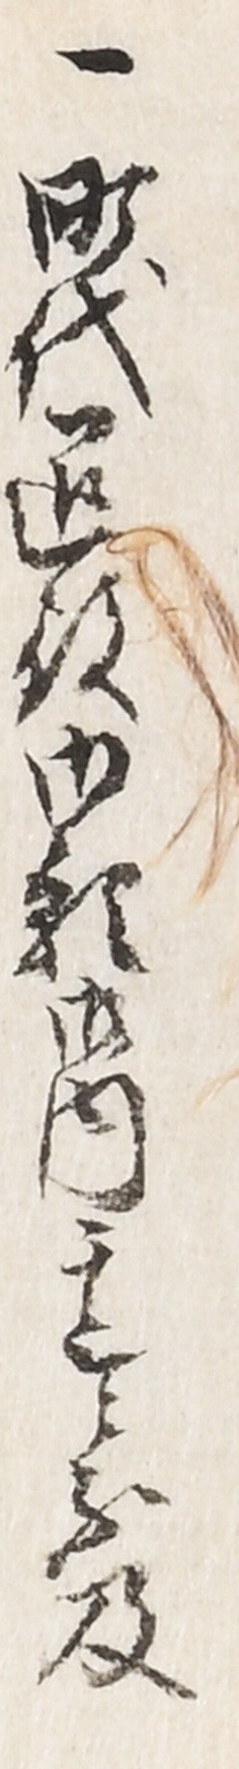一町代退役御頼御内意ニ不及
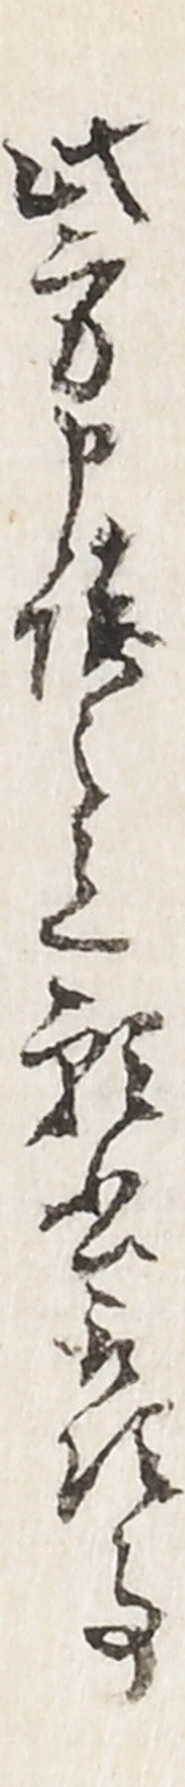此方申談之上願書取次事
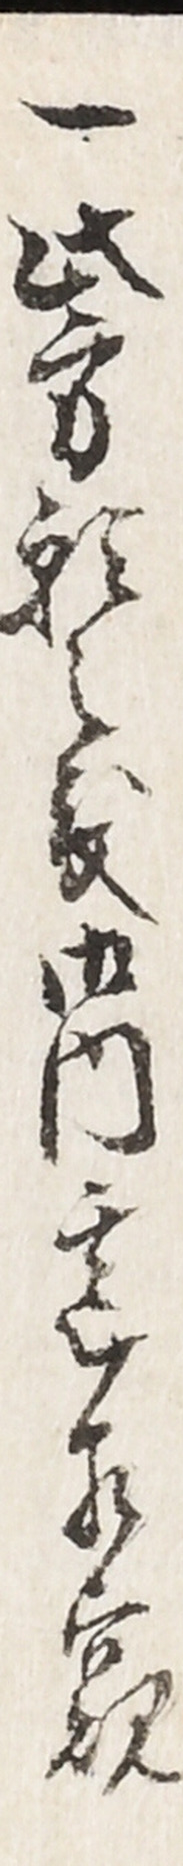一此方願之義御内意相窺
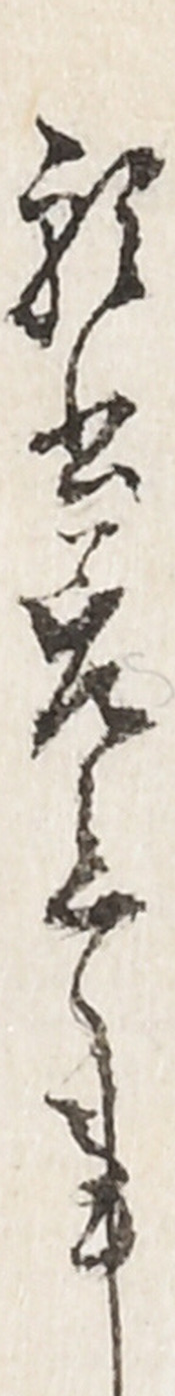願書差上事
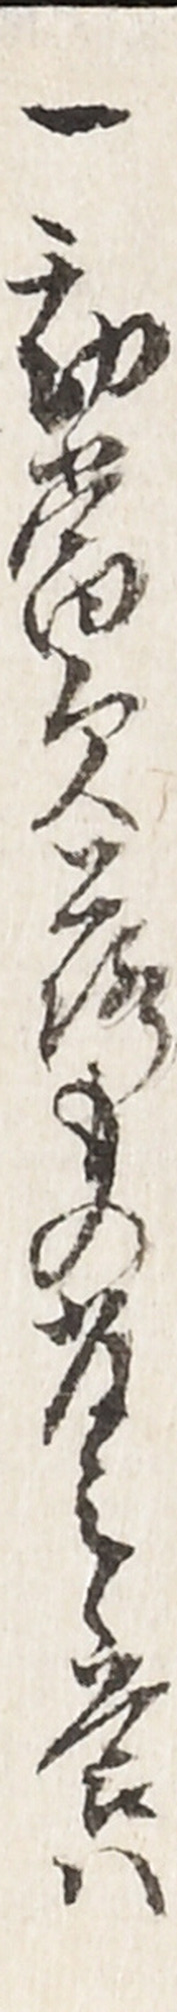一勘当欠落もの有之候節ハ
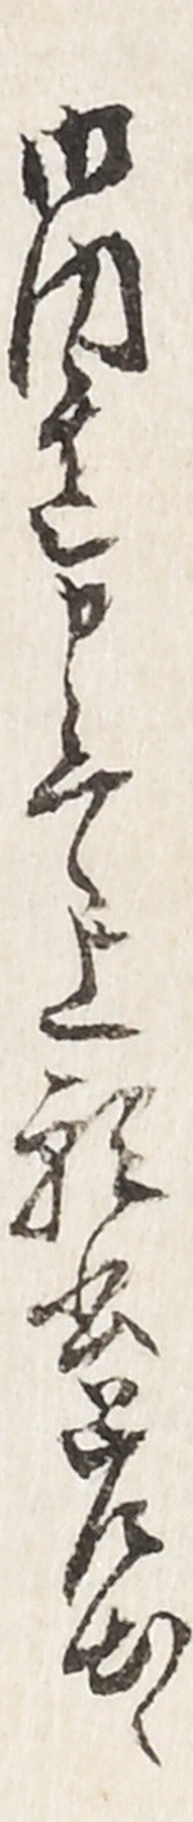御内意申上候上願書差出候
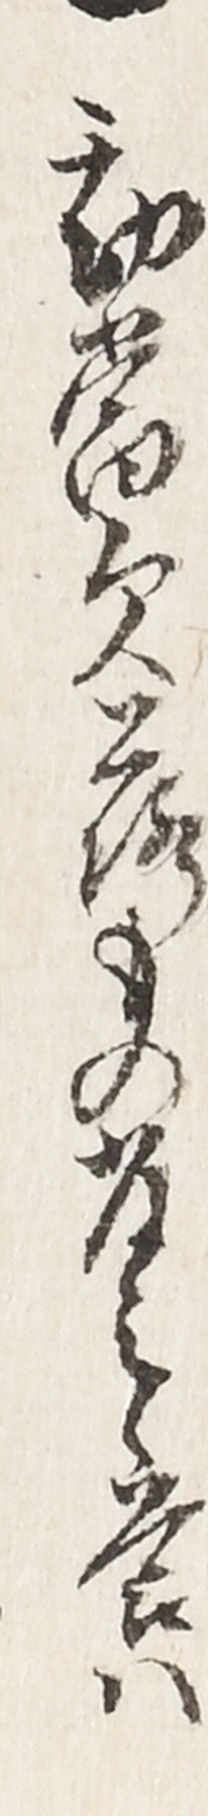一勘当欠落もの有之候節ハ
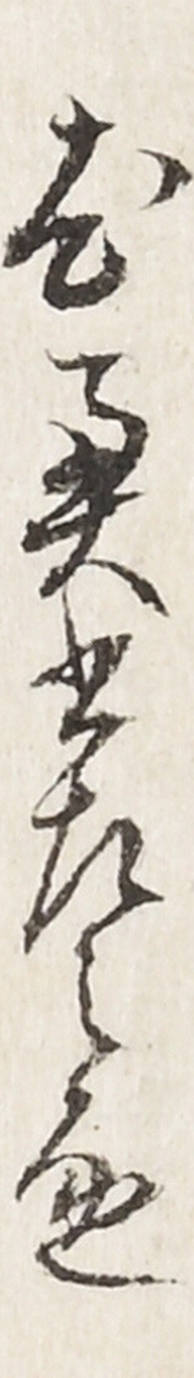尤奥書左之通
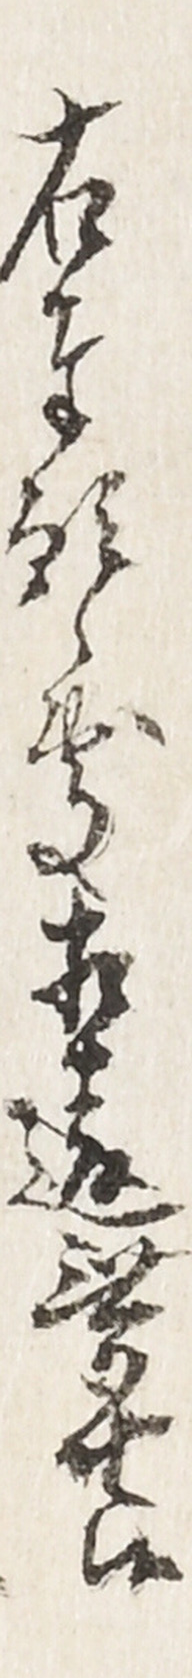右奉願候処相違無御座候
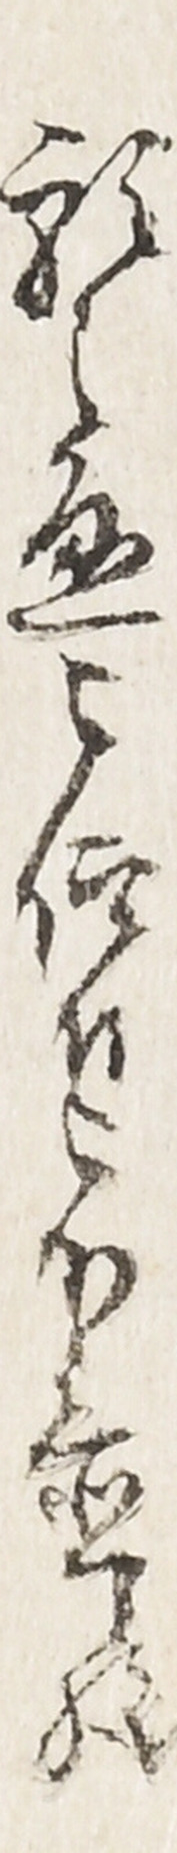願之通被仰付被下置候様
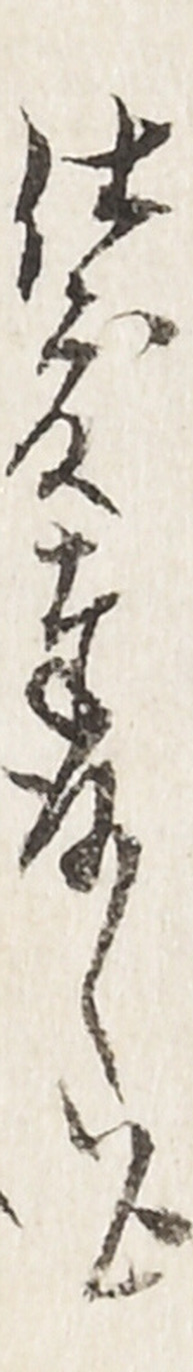仕度奉存候以上
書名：年内行事懐中録
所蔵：伊那市立高遠町図書館・合同会社AMANE
